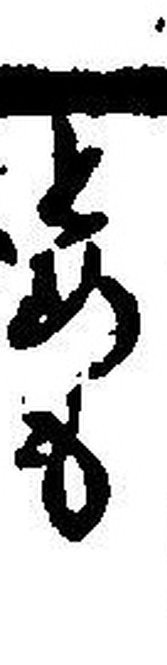とめも
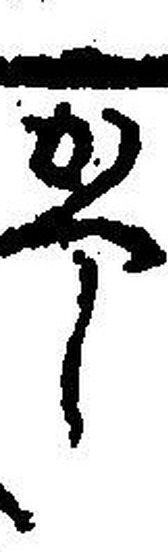かへし
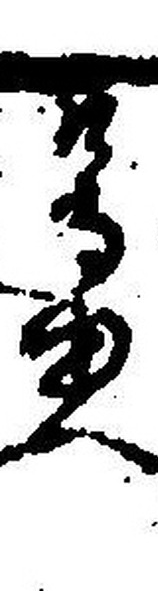けるゆへ
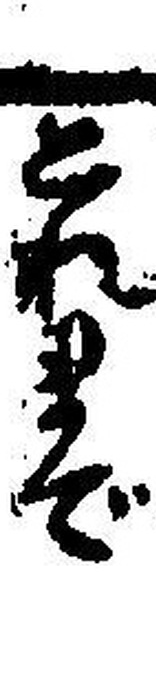これまで
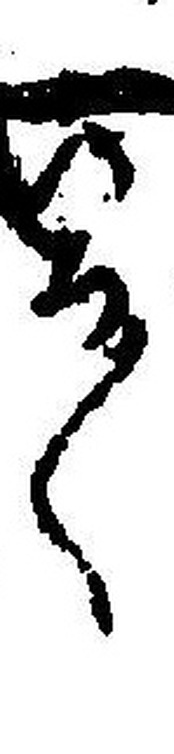いろ〳〵
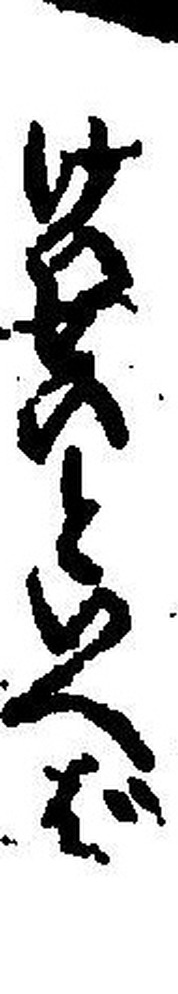けいせいといへば
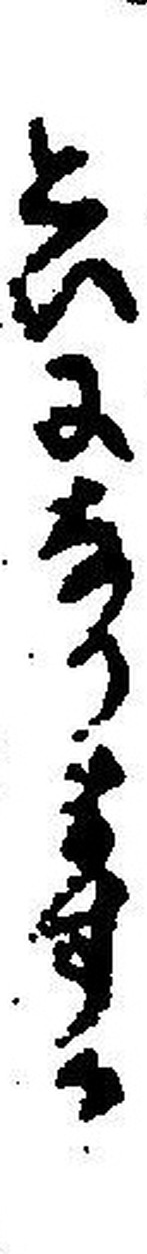といになりますか
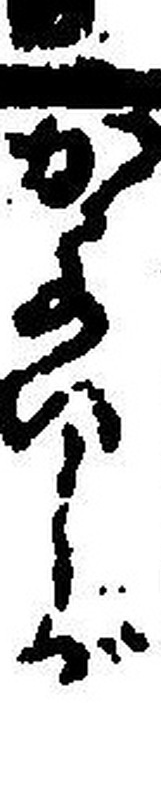かよいしが
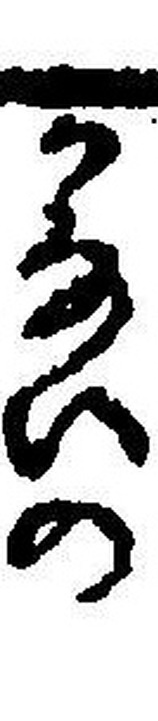かないの
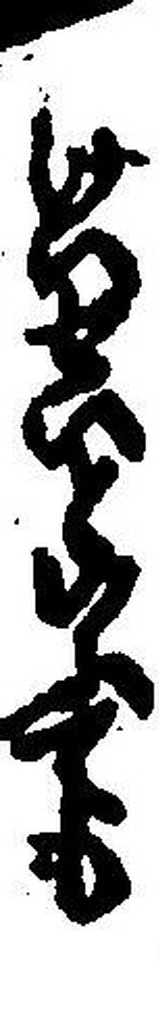けいせいといふても
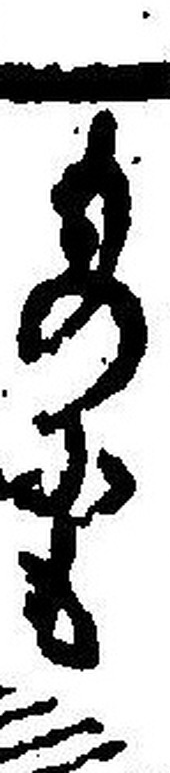ものにも
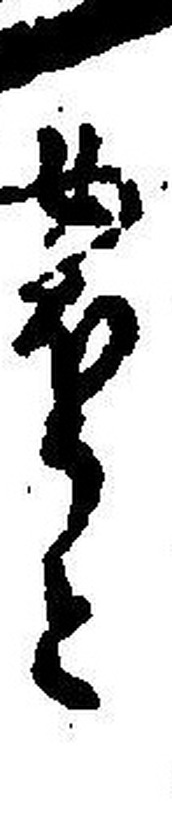女ほうと
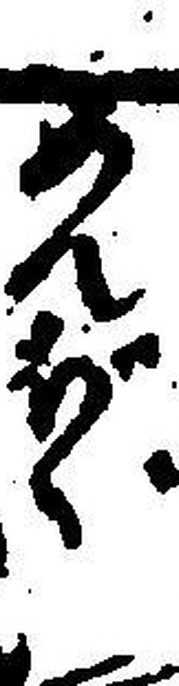めんぼく
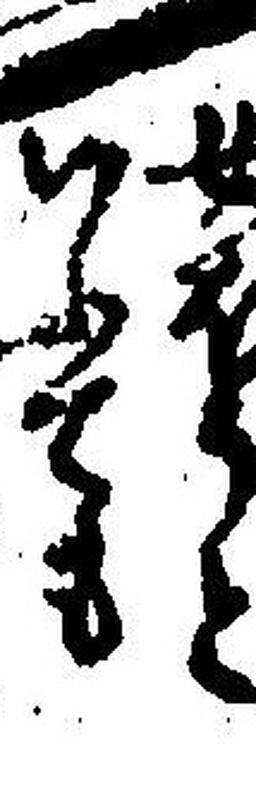いふても
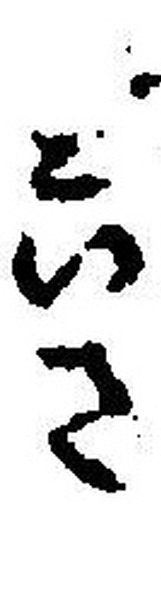こいさ
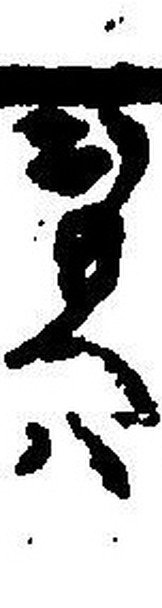おまへは
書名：御代参牛時詣 / 市場通笑作
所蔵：東京大学総合図書館 General Library in the University of Tokyo, JAPAN
